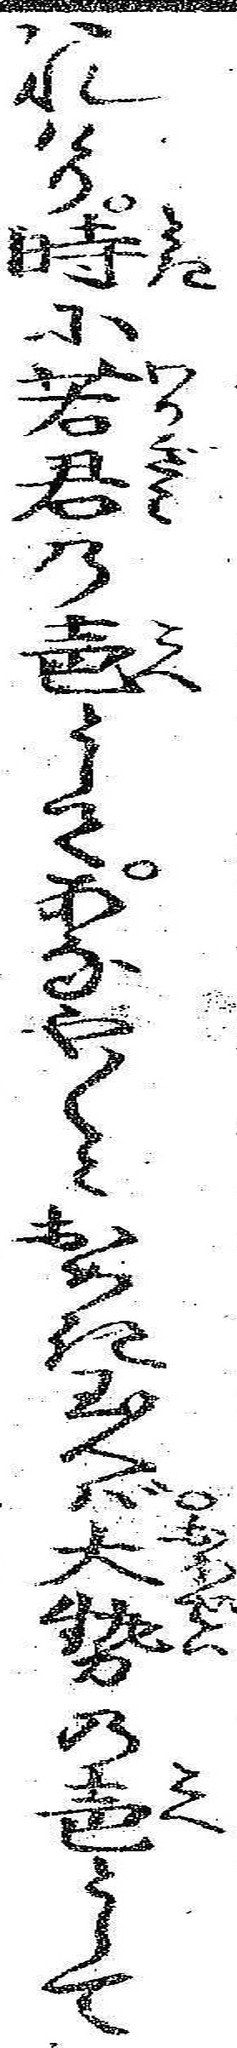はれけり。時に若君の声として。あなや〳〵とおめき玉へば。大勢の声として
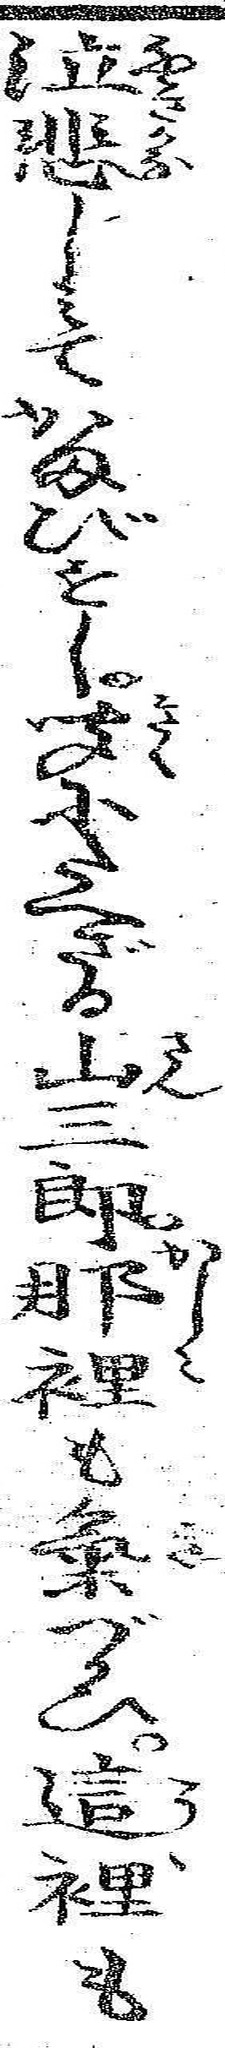泣悲しみてかまびすし。聞にたへざる山三郎。那裏も気づかひ。這裏も
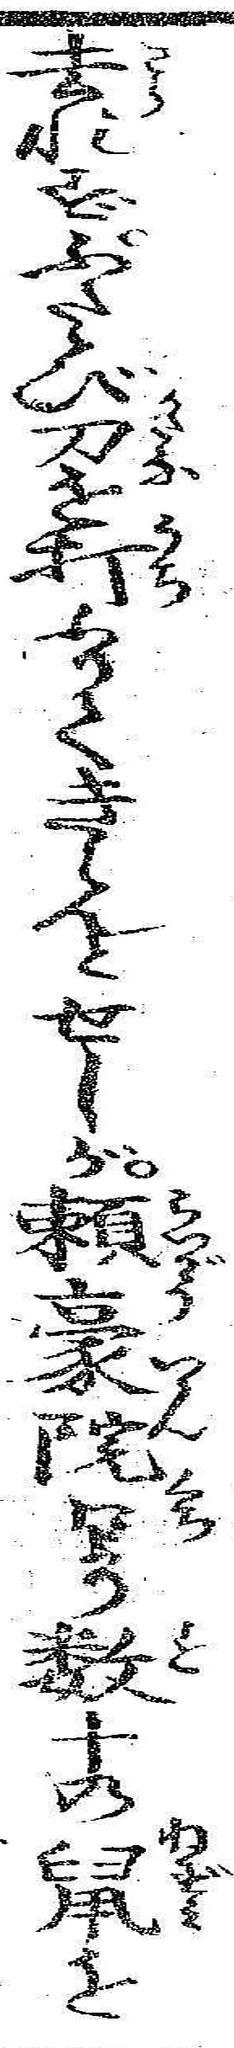去れず。ふたゝび刀を打ふりてきらんとせしが。頼豪院口より数十の鼠を
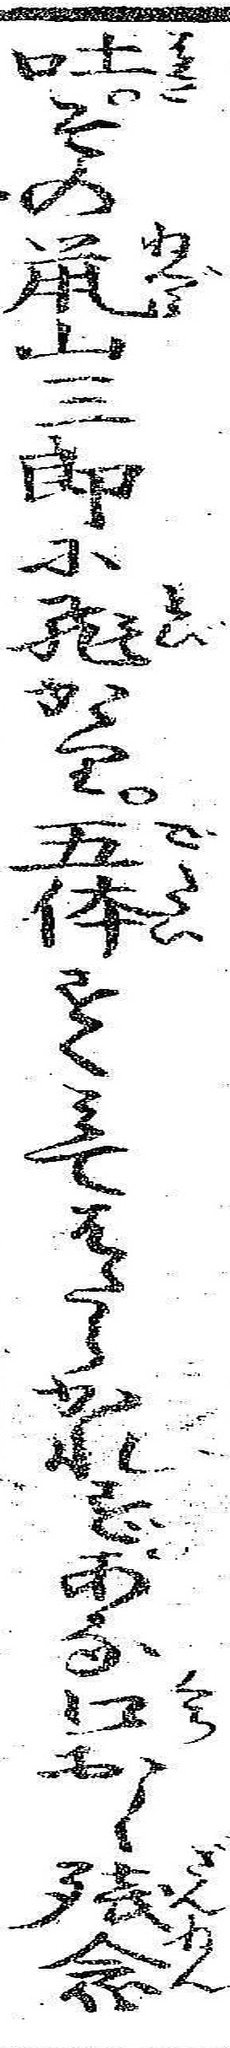吐。その鼠山三郎に飛かゝり。五体すくみてはたらかれず。あな口おし残念
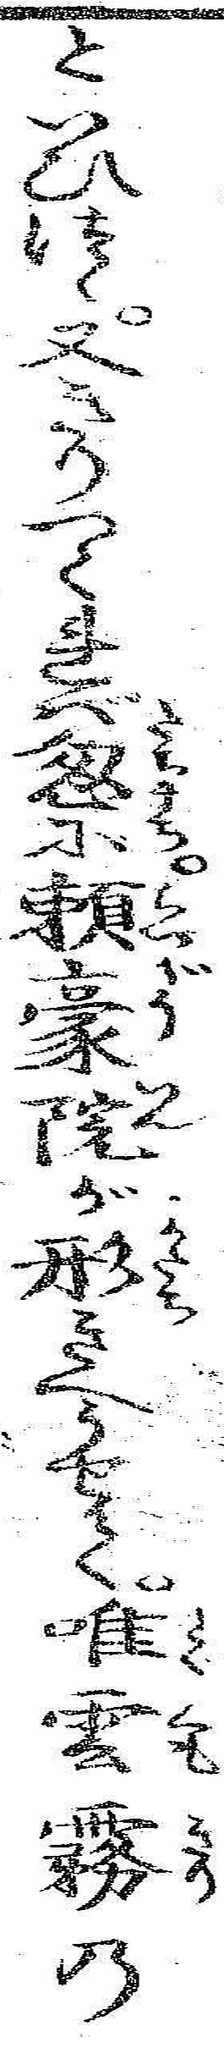といひつゝ。又きりつくれば忽に。頼豪院が形きへうせて。唯雲霧の
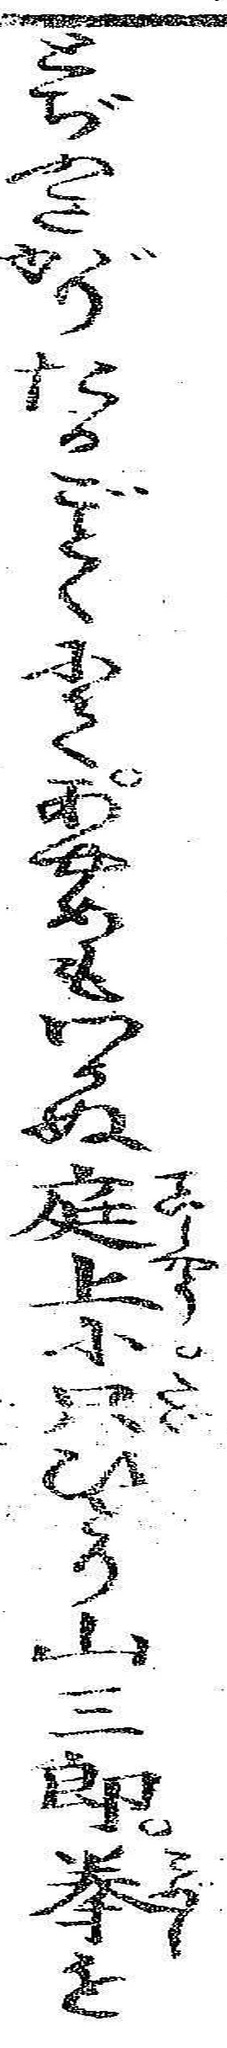とぢふさがりたるごとくにて。あやめもわかぬ庭上に。只ひとり山三郎。挙を
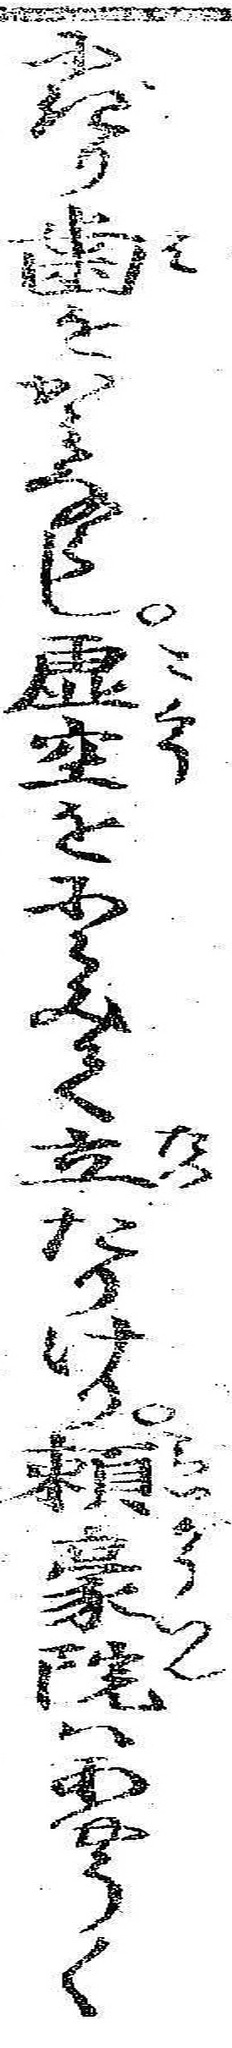にぎり歯をかみならし。虚空をにらみて立たりけり。頼豪院はあやうく
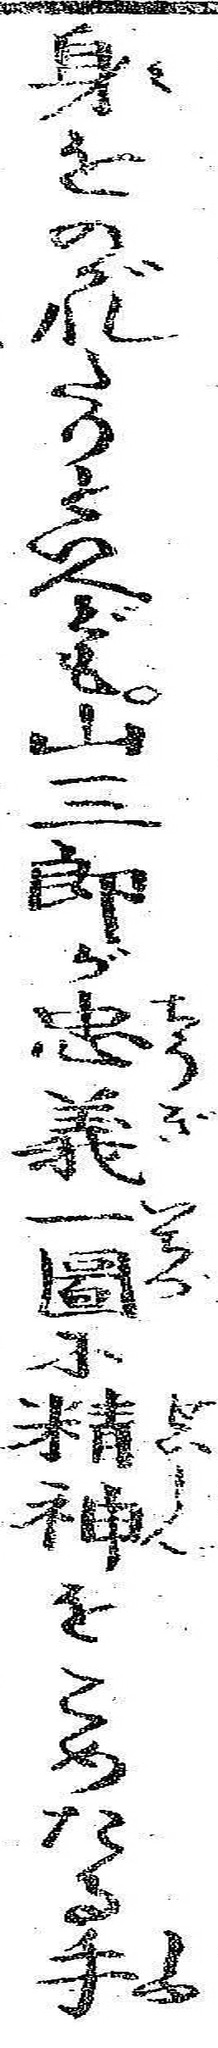身をのがれたりといへども。山三郎が忠義一図に精神をこめたる手
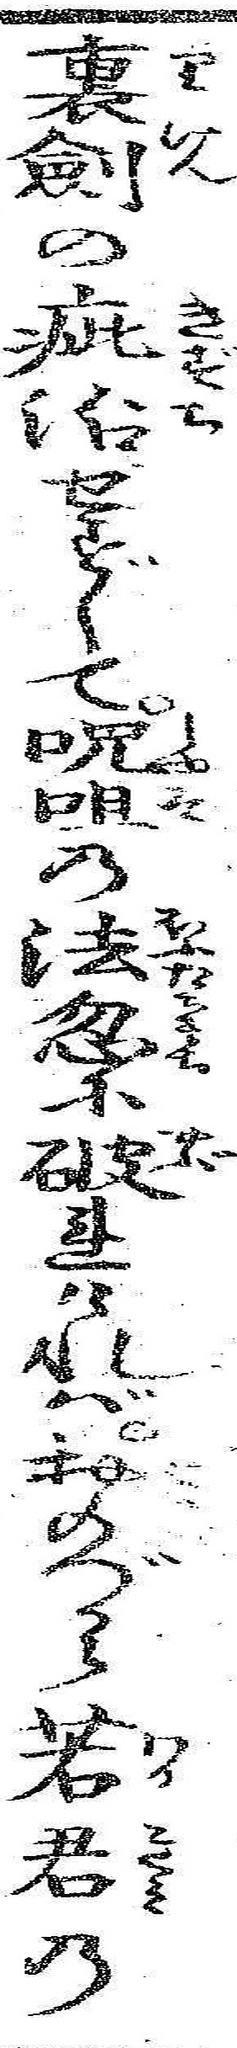裏剣の疵治せずして。呪咀の法忽に破れければ。おのづから若君の
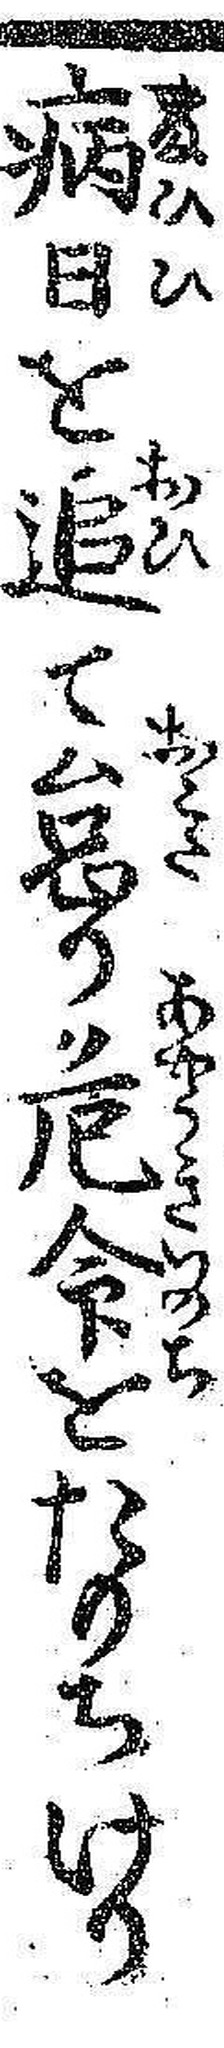病日を追て怠り危命をたもちけり
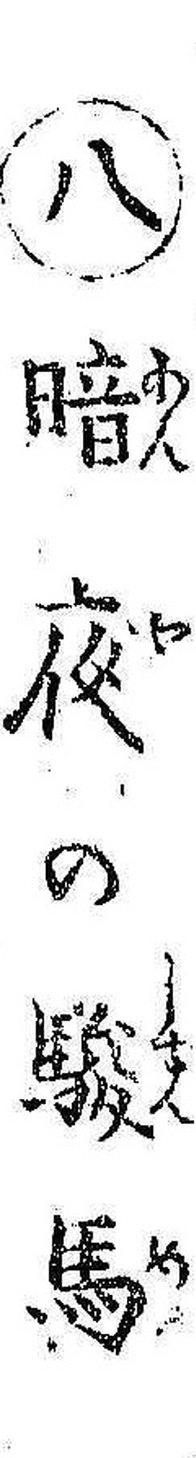八暗夜の駿馬
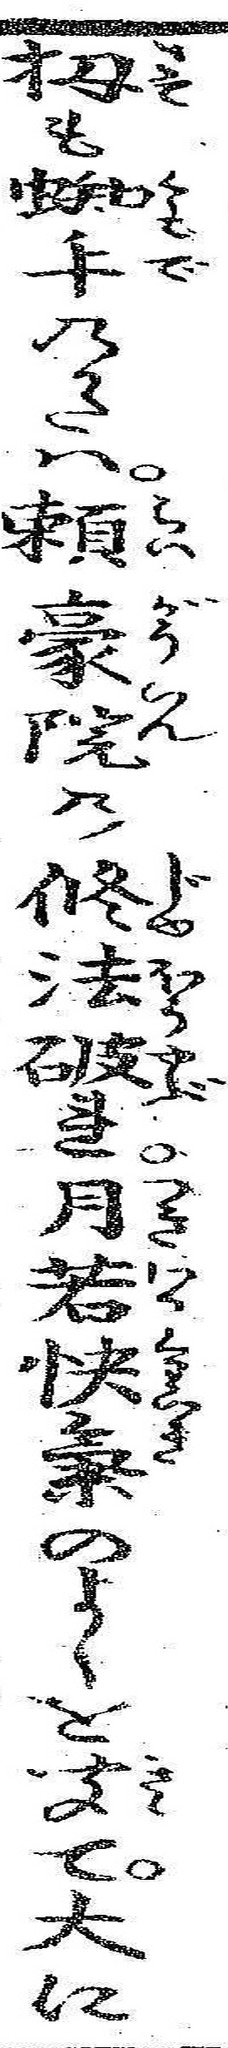扨も蜘手のかたは。頼豪院の修法破れ。月若快気のよしを聞て。大に
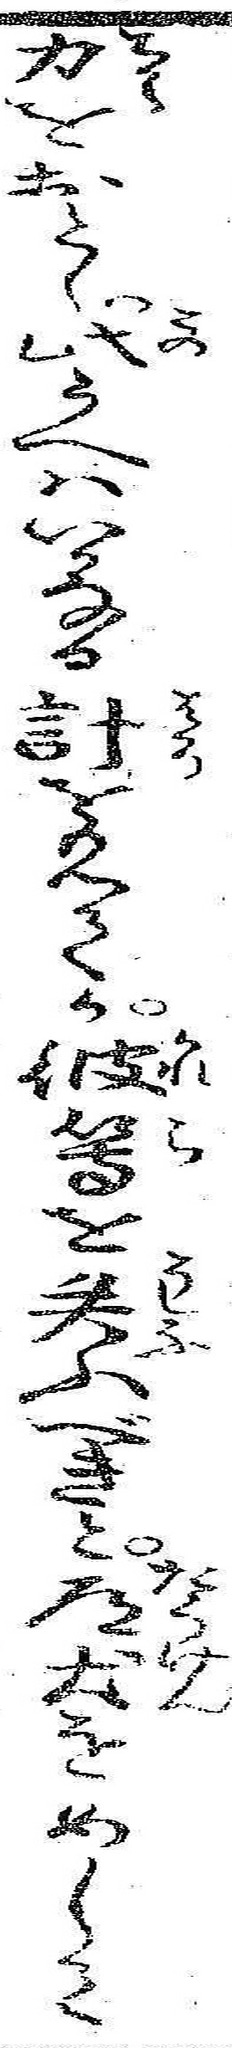力をおとし。此うへはいかなる計をもつてか。彼等を失ふべきと。道犬をめして
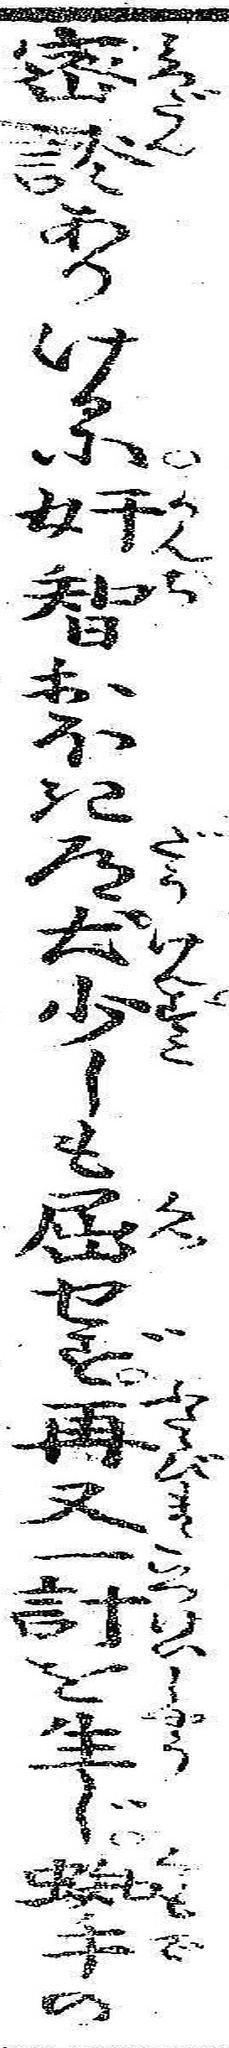密談ありけるに。奸智おほき道犬。少しも屈せず。再又一計を生じ。蜘手の
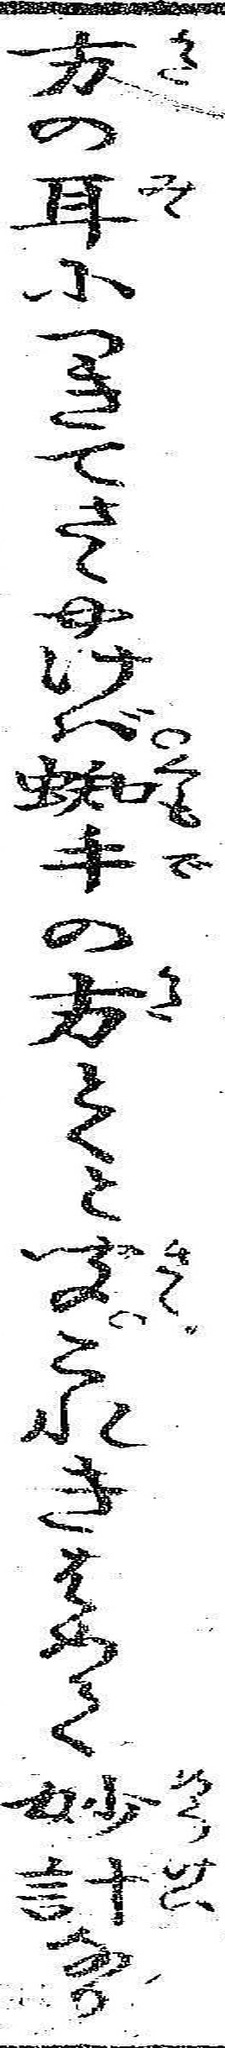方の耳につきてさゝやけば。蜘手の方とくと聞。これきはめて妙計なり
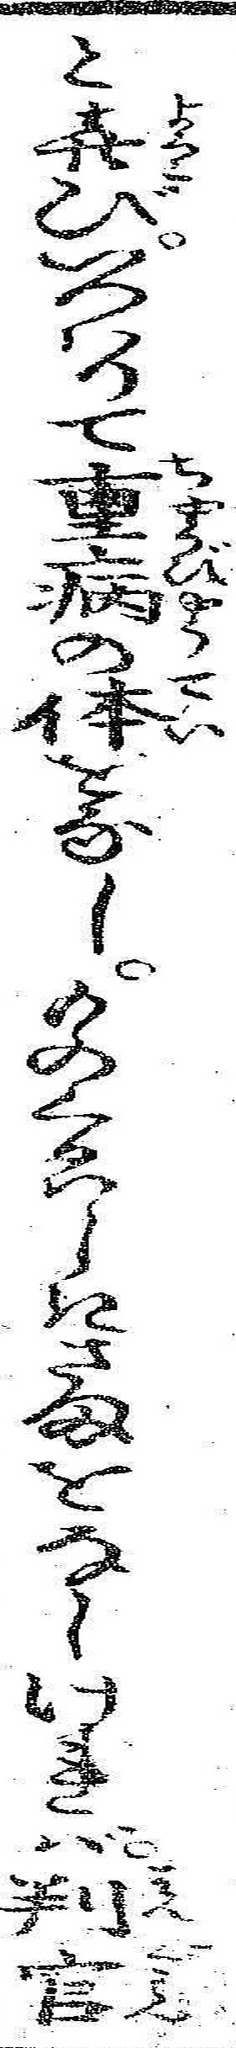と喜び。いつはりて重病の体をなし。ものくるはしきさまをなしければ。判官
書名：昔話稲妻表紙
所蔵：国文学研究資料館
